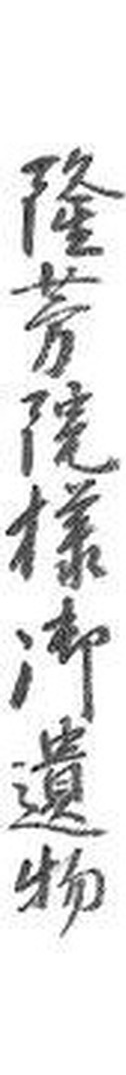隆芳院様御遺物
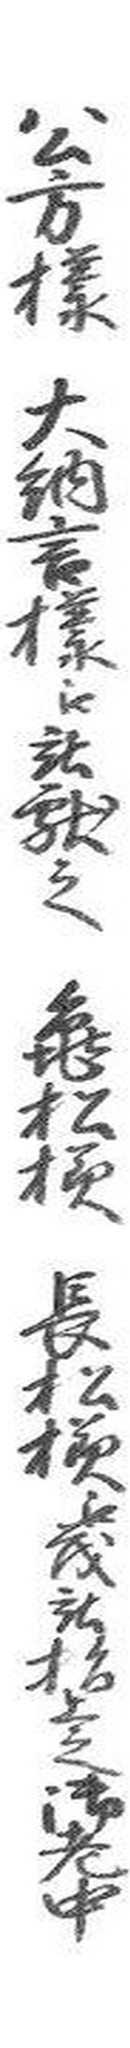公方様大納言様江被献之亀松様長松様江茂被指上之御
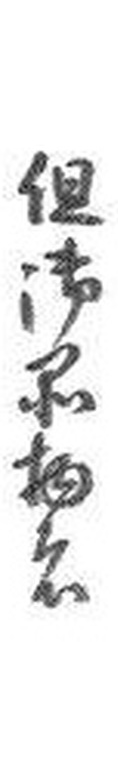但御品物者
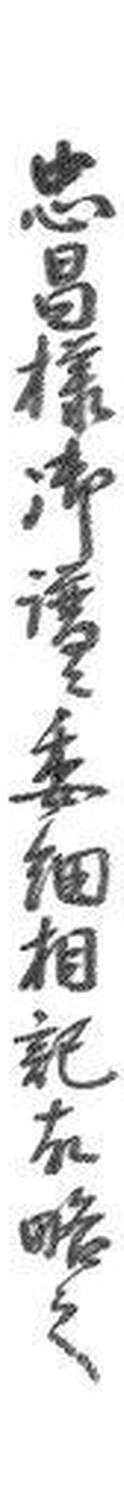忠昌様御譜ニ委細相記故略之
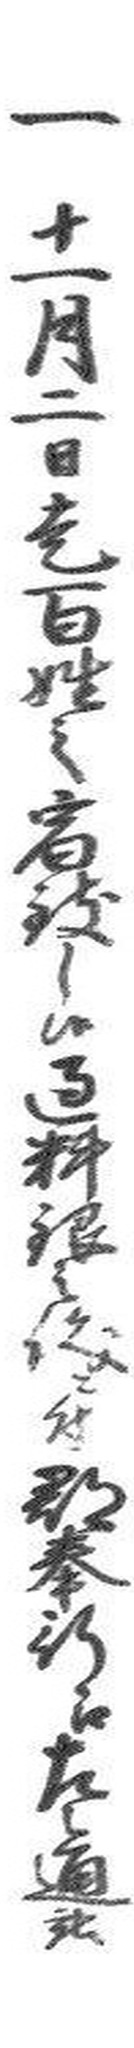一十一月二日走百姓之宿致し候過料銀之儀ニ付郡奉行江左之通被
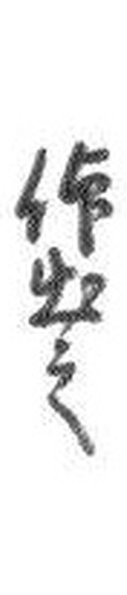仰出之
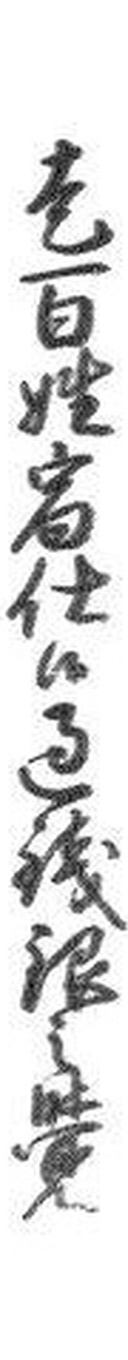走百姓宿仕候過銭銀之覚
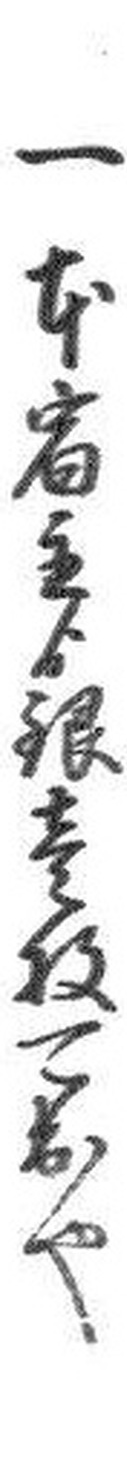一本宿主ゟ銀壱枚可出也
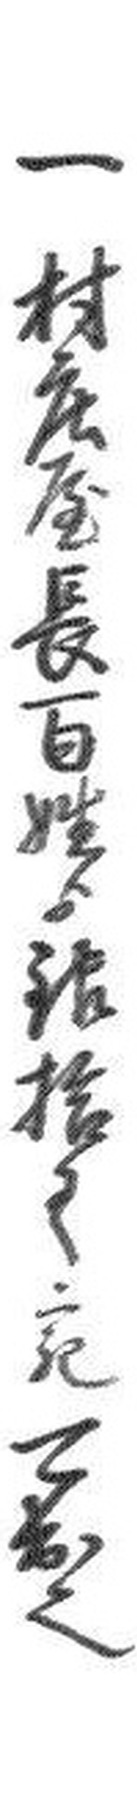一村庄屋長百姓ゟ銀拾匁宛可出也
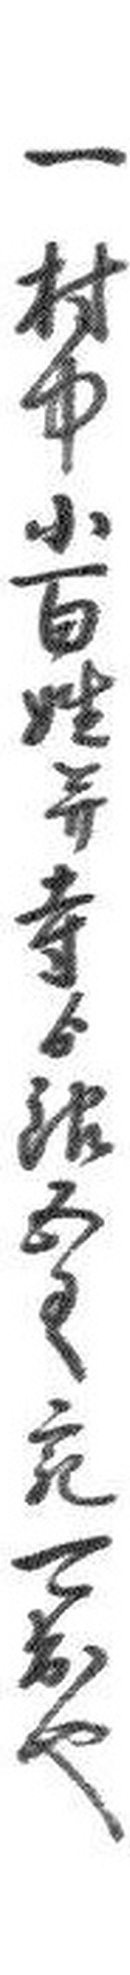一村中小百姓并寺ゟ銀五匁宛可出也
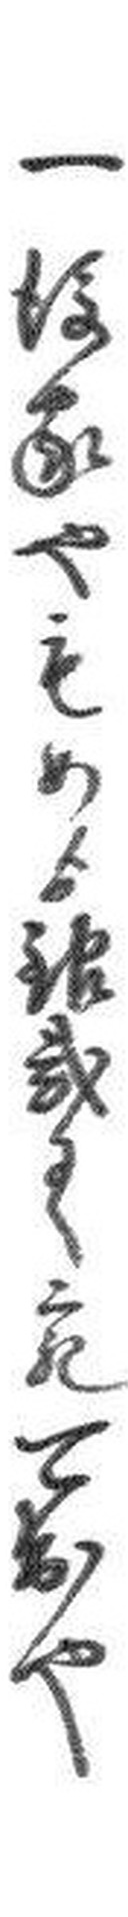一後家やもめゟ銀弐匁宛可出也
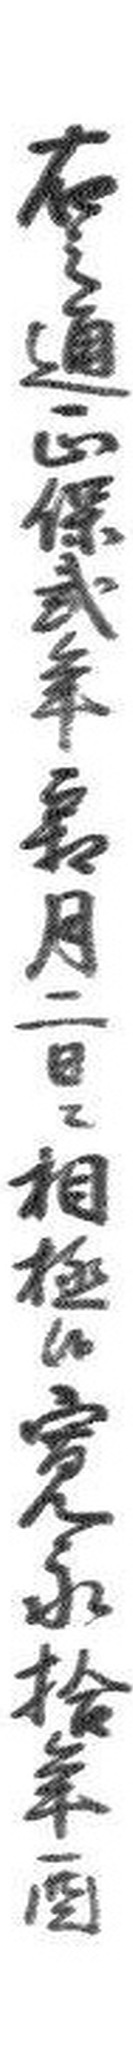右之通正保弐年霜月二日ニ相極候寛永拾年酉
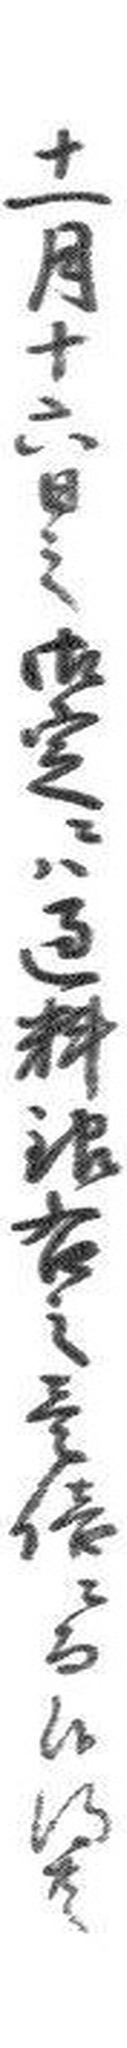十一月十六日之御定ニハ過料銀右之壱倍ニ而候得共
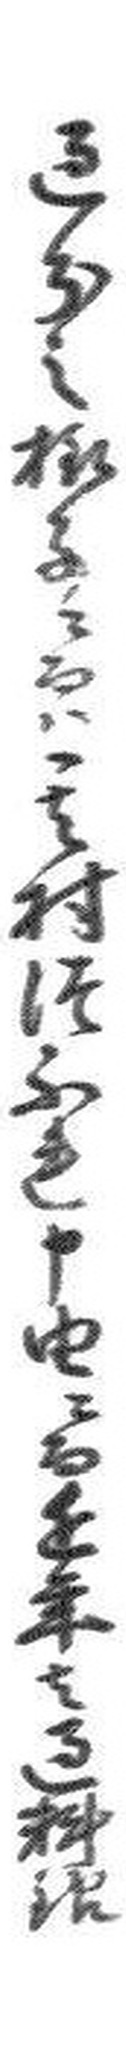過分之様子ニ而ハ其村つふれ申由ニ而近年者過料銀

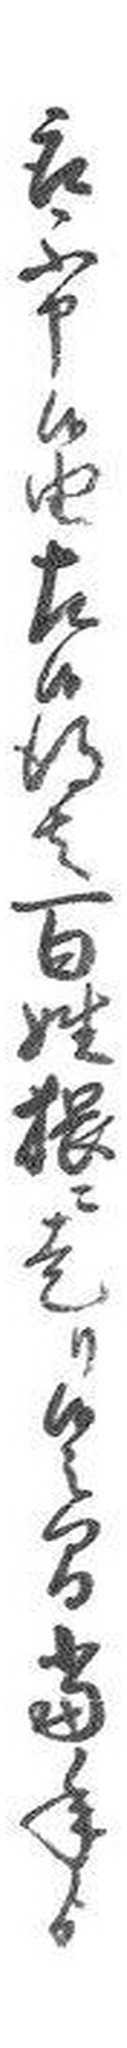取不申候由左候得者百姓猥ニ走り候之間当年ゟ
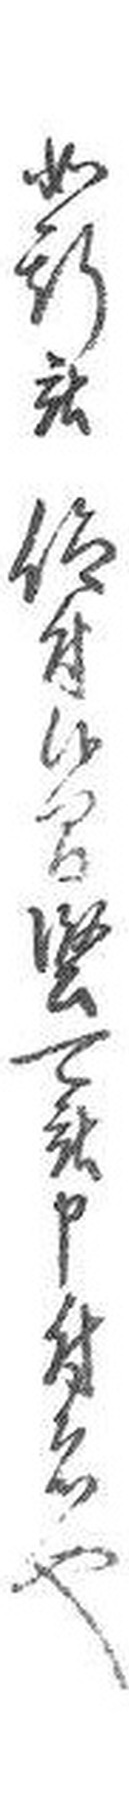如斯被仰付候間堅可被申付者也
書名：家譜 五 光通公 従寛永十三年到万治二年
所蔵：福井県文書館 Fukui Prefectural Archives
